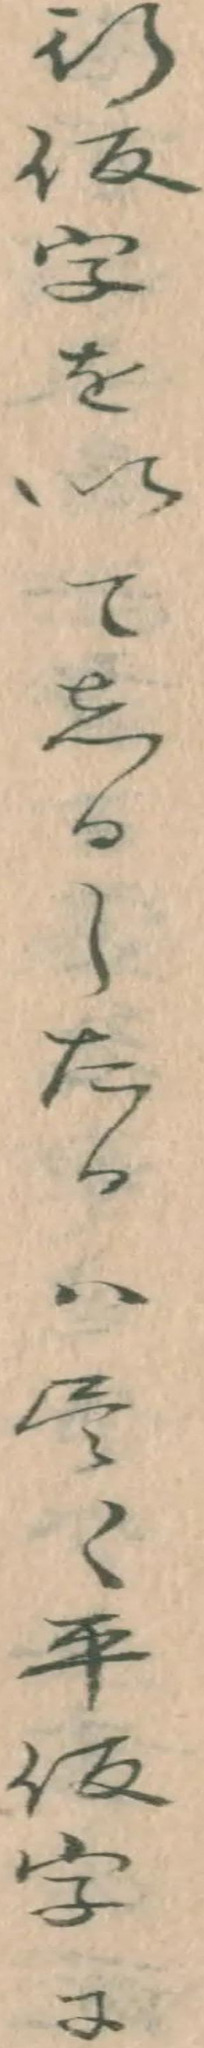行仮字を以てしるしたるは尽く平仮字に
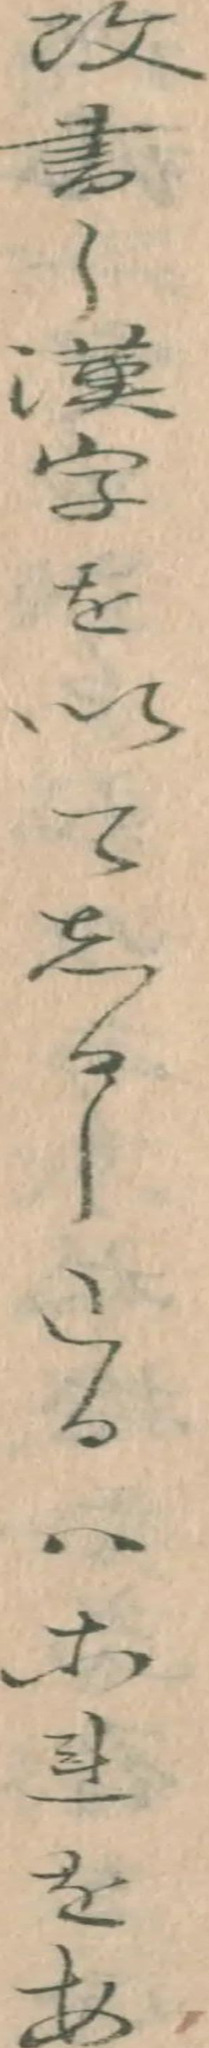改書し漢字を以てしるしたるはこれをあ
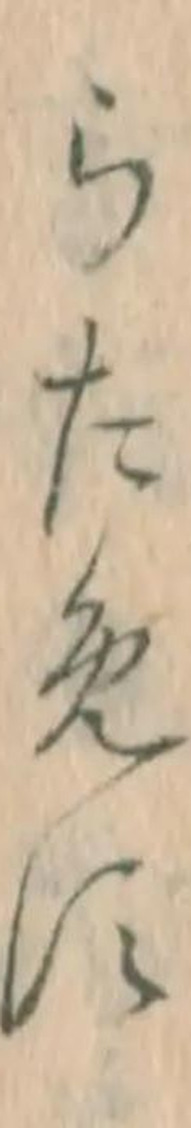らためす

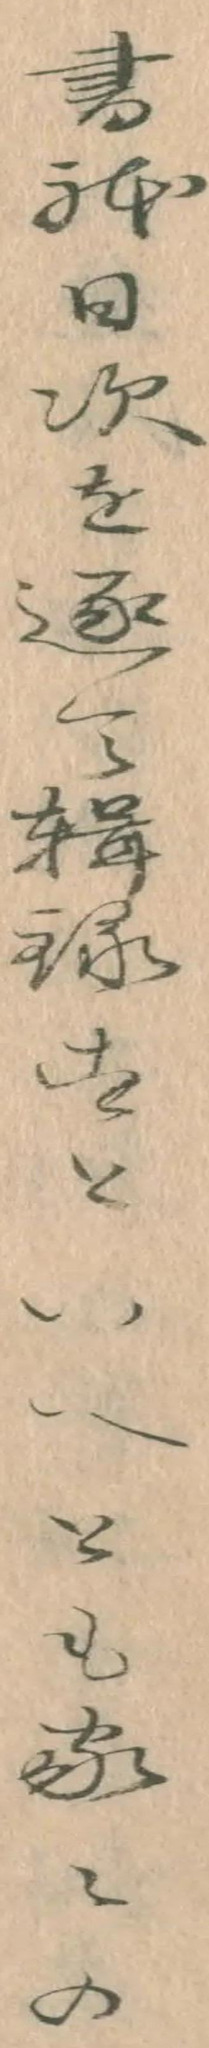一書体日次を逐て輯録すといへとも家々の
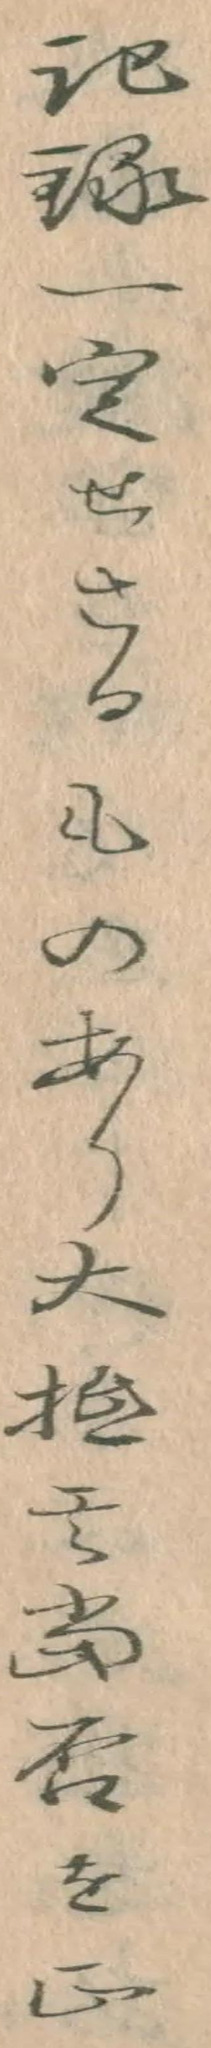記録一定せさるものあり大抵其当否を正
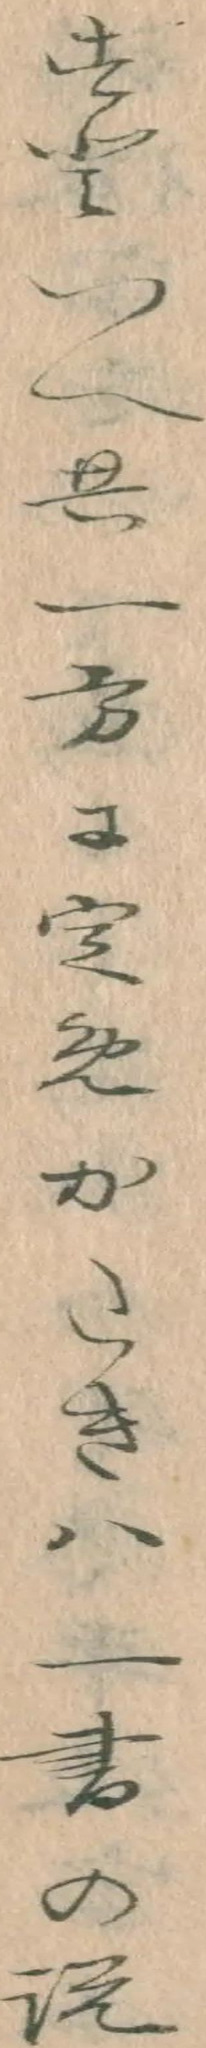すといへ共一方に定めかたきは一書の説
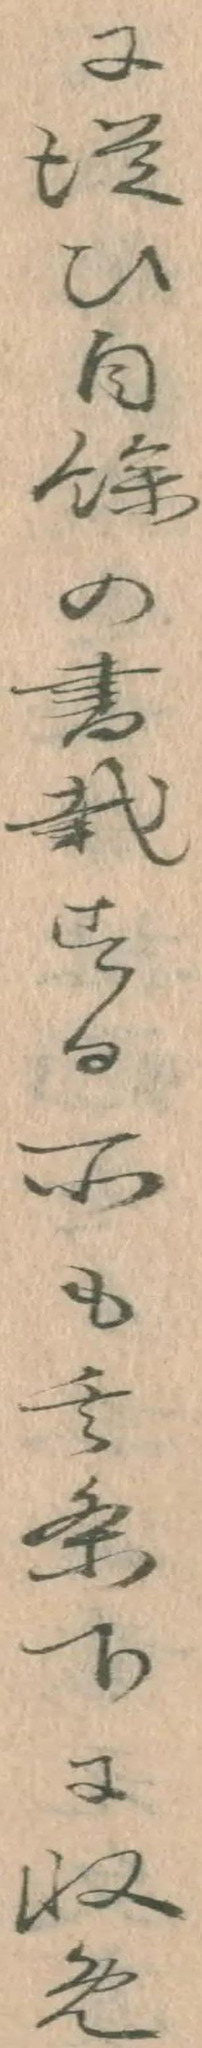に従ひ自余の書載する所も其条下に収め
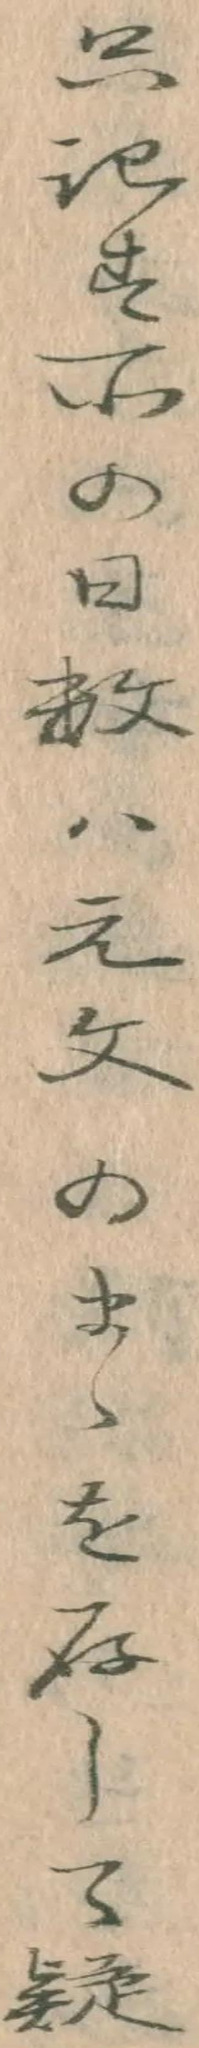只記す所の日数は元文のまゝを存して疑
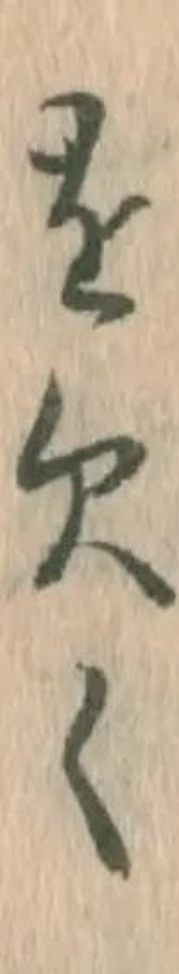を欠く
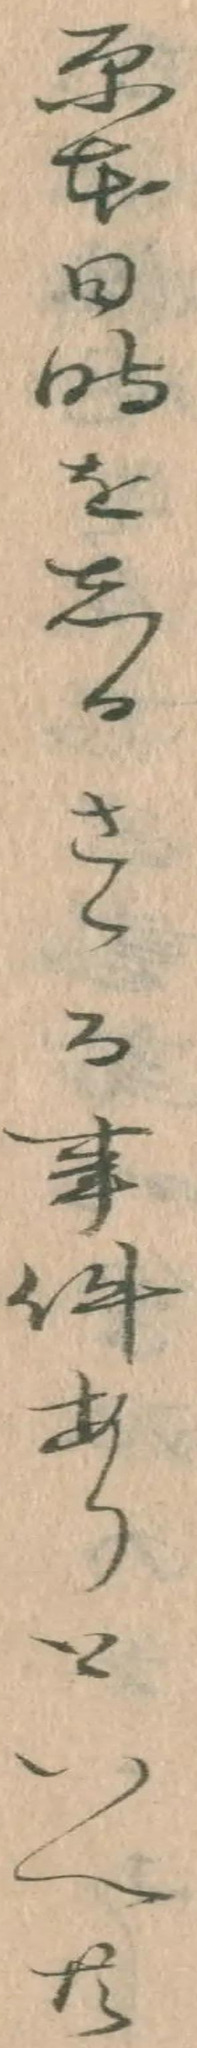一原本日時をしるさゝる事件ありといへ共
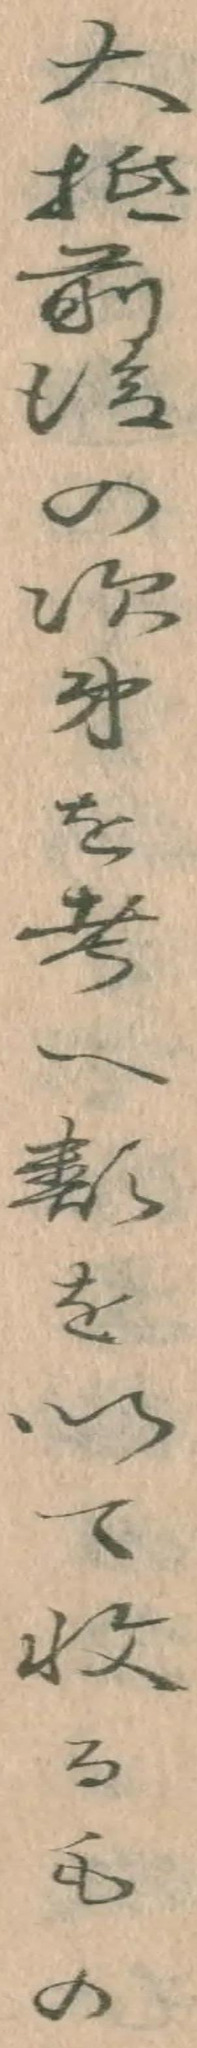大抵前後の次第を考へ類を以て収るもの
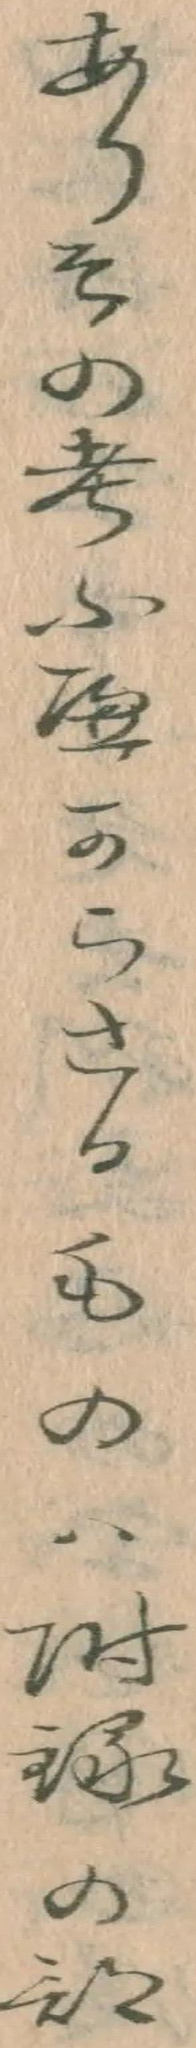ありその考ふへからさるものは附録の部
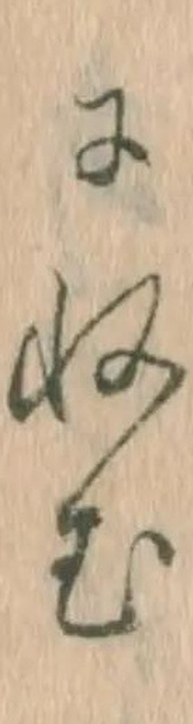に収む
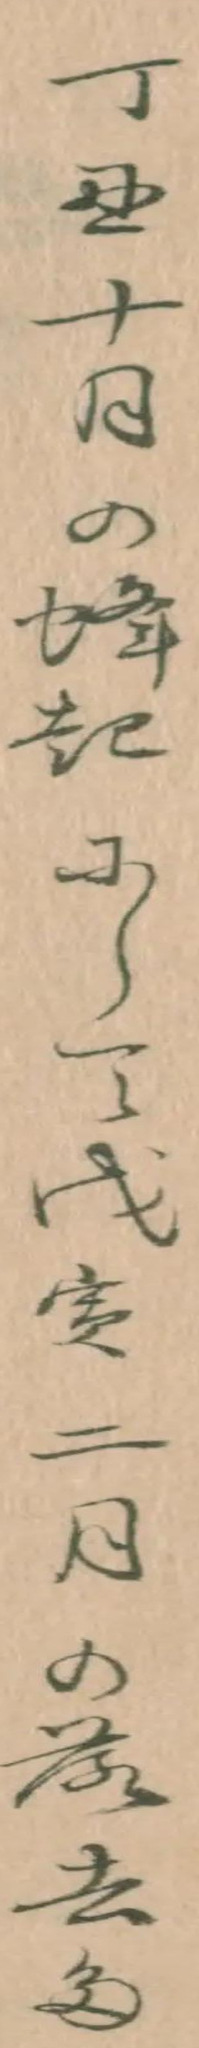一丁丑十月の蜂起にして戊寅二月の落去た
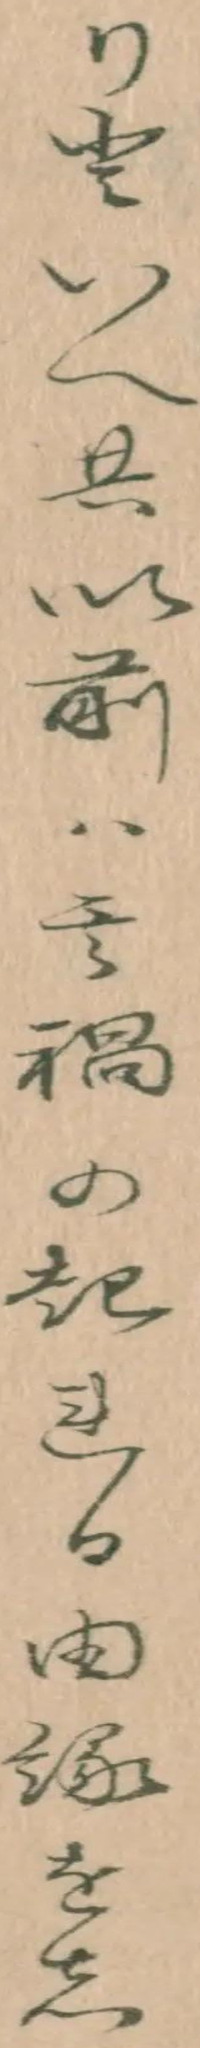りといへ共以前は其禍の起れる由縁をし
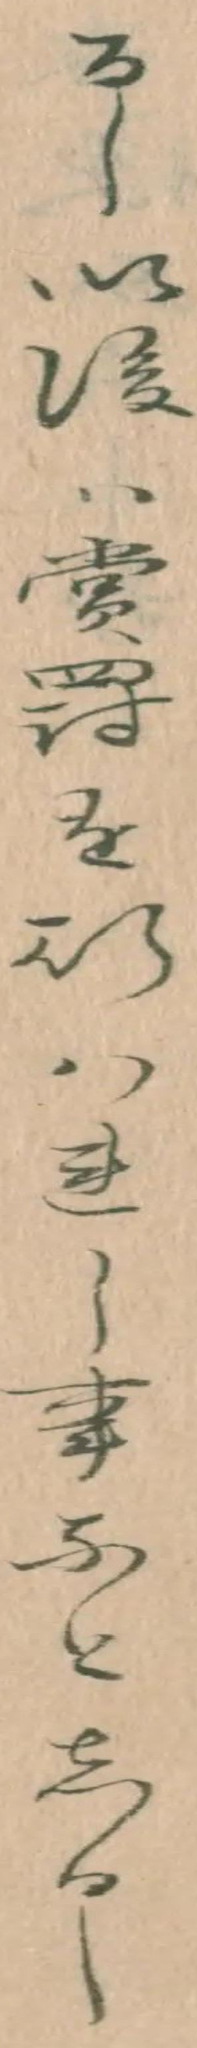るし以後は賞罰を行はれし事なとしるし
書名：切支丹御退治記 49巻. [1]
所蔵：国立国会図書館 National Diet Library, JAPAN
